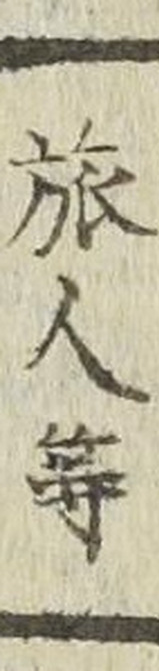旅人等
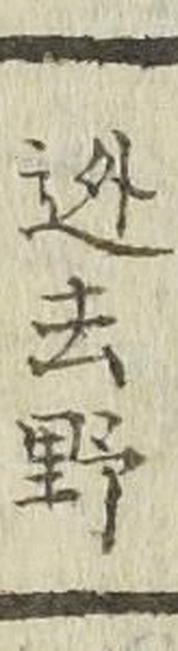迯去野
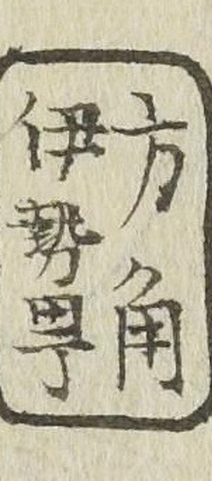伊勢町
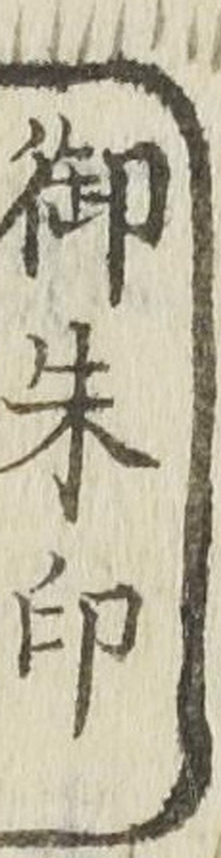御朱印
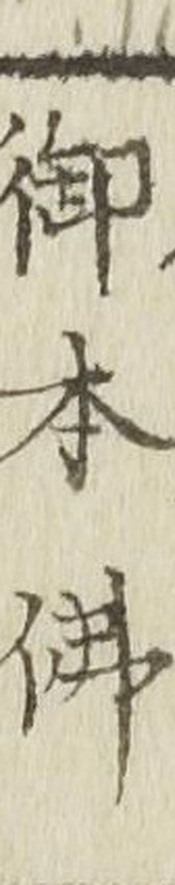御本仏
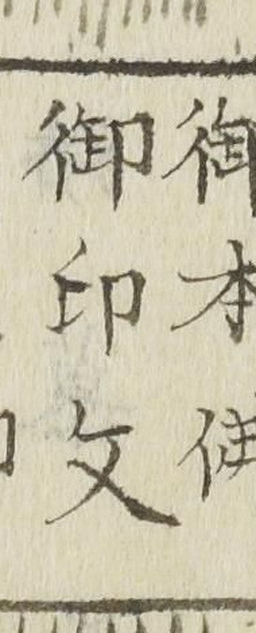御印文
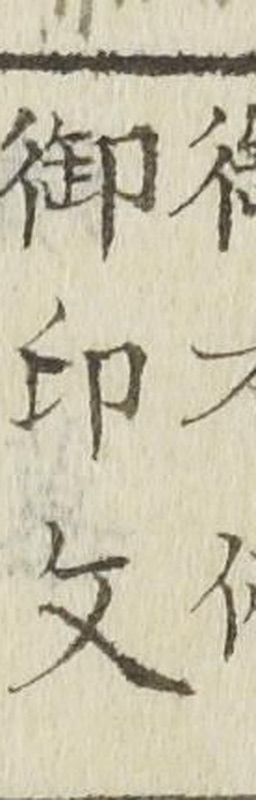御印文
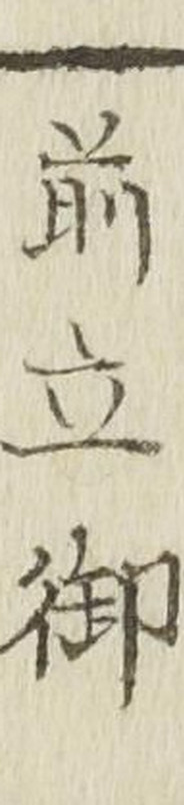前立御
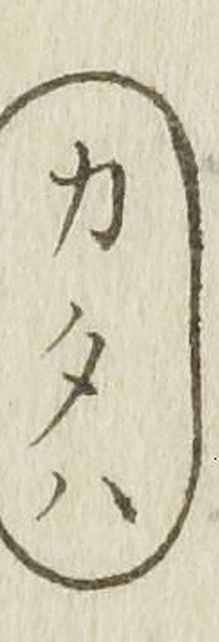カタハ

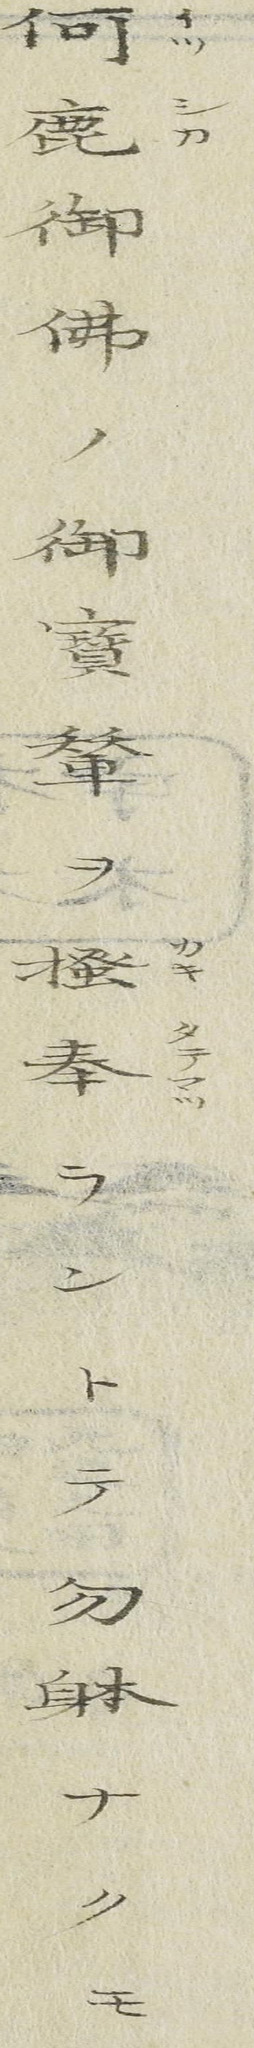何鹿御仏ノ御宝輦ヲ掻奉ラントテ勿体ナクモ
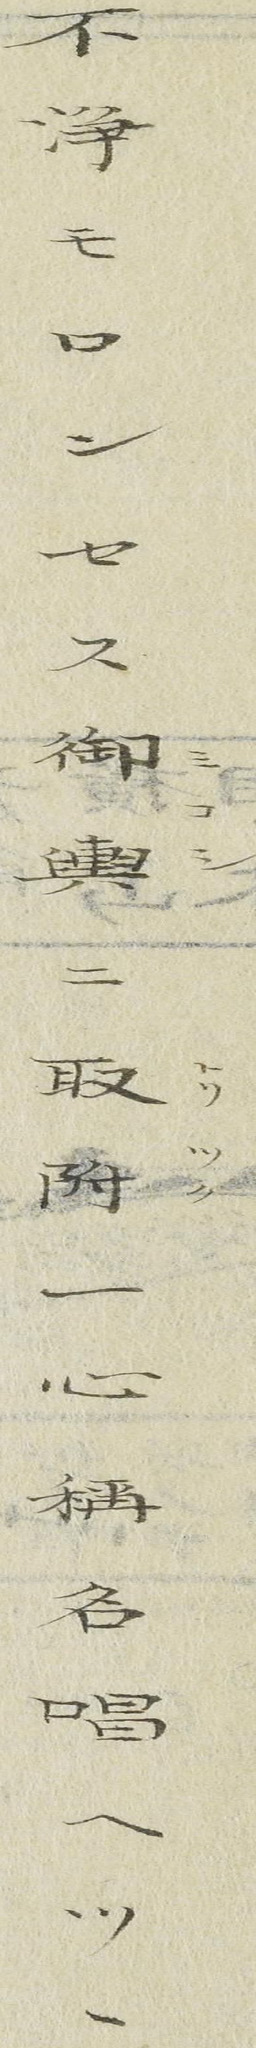不浄モロンセス神輿ニ取附一心称名唱ヘツヽ
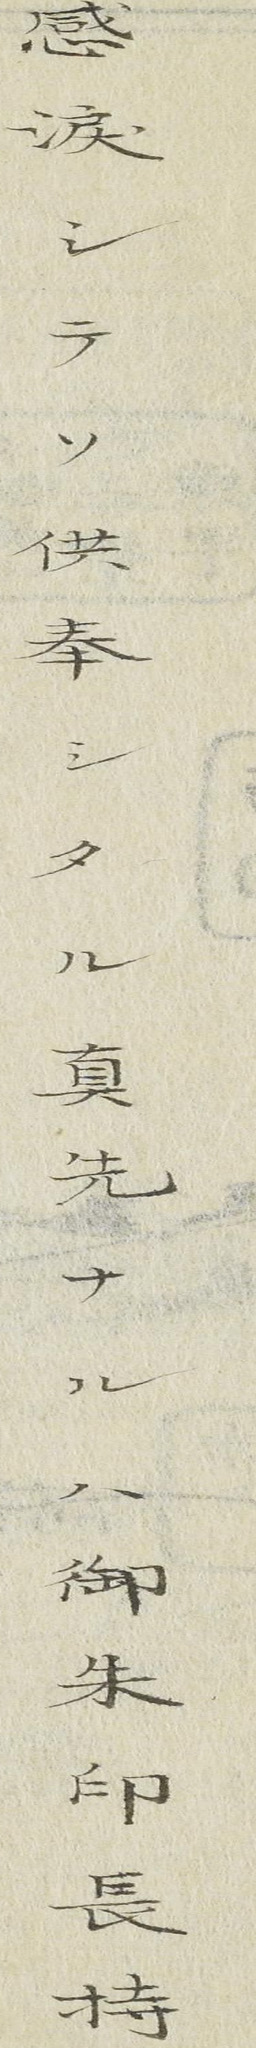感涙シテソ供奉シタル真先ナルハ御朱印長持
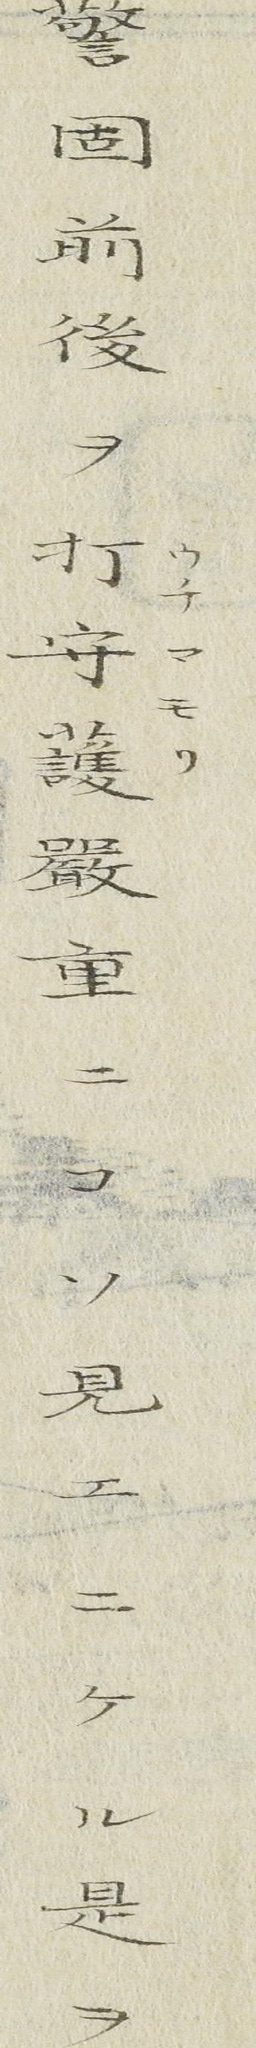警固前後ヲ打守護厳重ニコソ見エニケル是ヲ
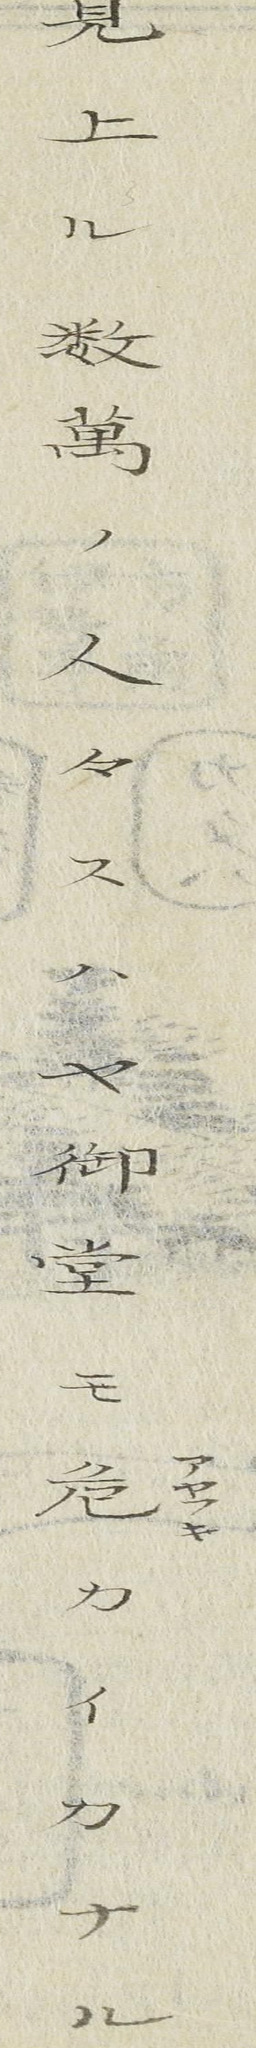見上ル数万ノ人々スハヤ御堂モ危カイカナル
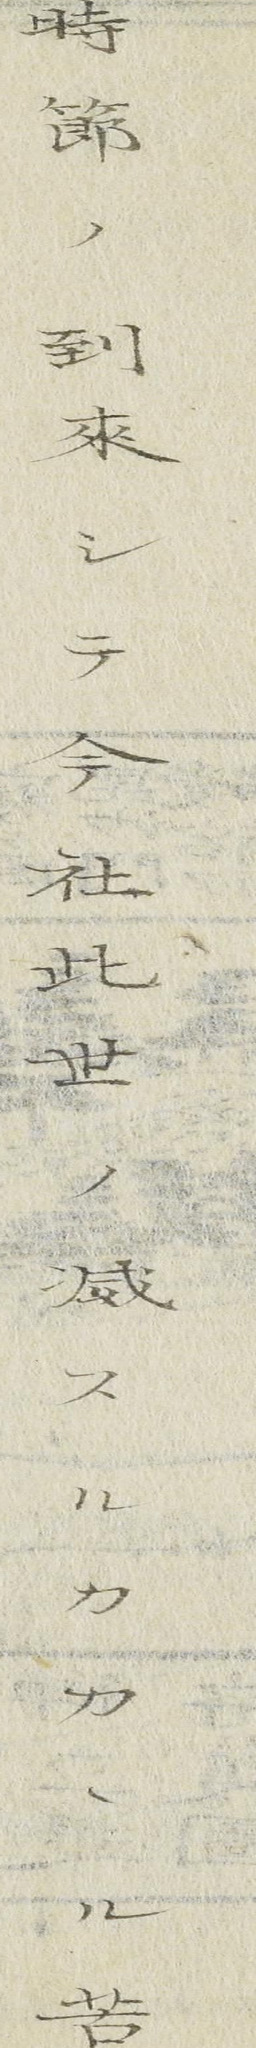時節ノ到来シテ今社此世ノ滅スルカカヽル苦
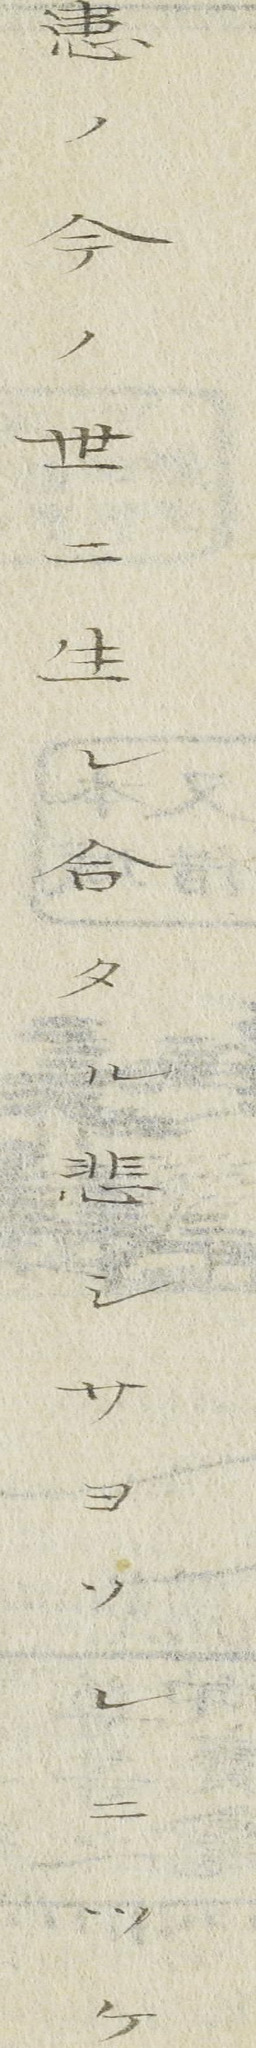患ノ今ノ世ニ生レ合タル悲シサヨソレニツケ
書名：地災撮要　地震之部　巻ノ二
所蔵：東京大学地震研究所図書室 Earthquake Research Institute Library, The University of Tokyo, JAPAN
